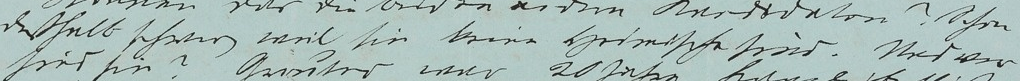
deßhalb schwer, weil sie keine Heimische sind. Und wer
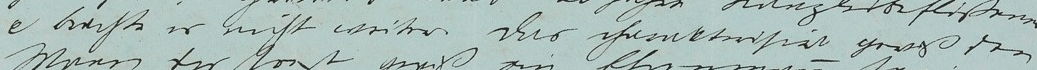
& brachte es nicht weiter. Das charakterisirt gewiß den
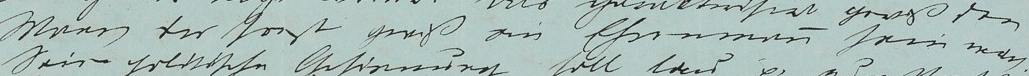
Mann, der sonst gewiß ein Ehrenmann sein mag.
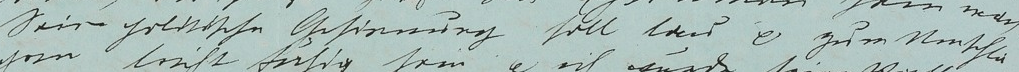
Seine politische Gesinnung soll lau & zum Umschla-
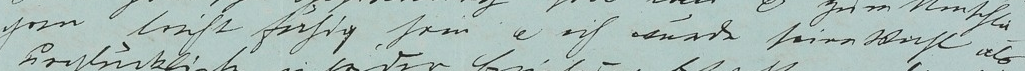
gen leicht fähig sein & ich würde seine Wahl als
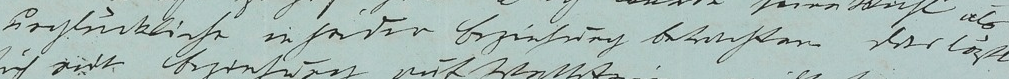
unglückliche in jeder Beziehung betrachten. Das läßt
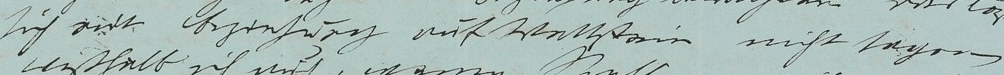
sich mit Beziehung mit Wettstein nicht sagen,
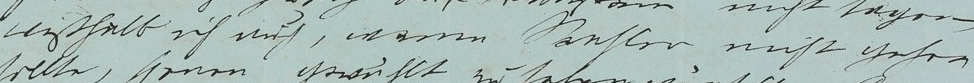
weßhalb ich auch, wenn Strehler nicht gehen
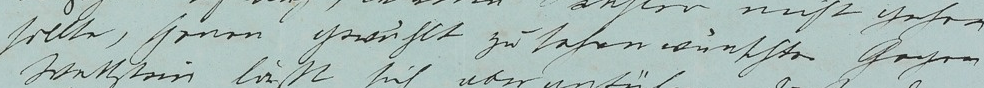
sollte, jenen gewählt zu sehen wünschte. Gegen
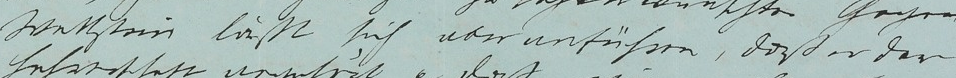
Wettstein läßt sich aber anführen, daß er der
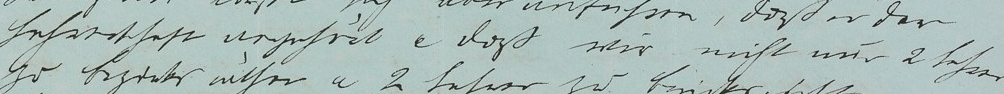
Lehrerschaft angehört & daß wir nicht nur 2 Lehrer
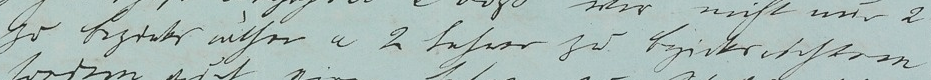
zu Bezirksräthen & 2 Lehrer zu Bezirksrichtern,
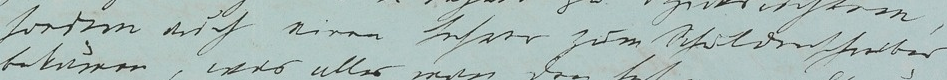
sondern auch einen Lehrer zum Schuldenschreiber
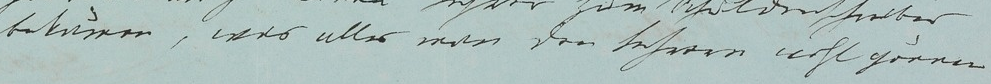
bekämen, was alles man den Lehrern wohl gönnen
